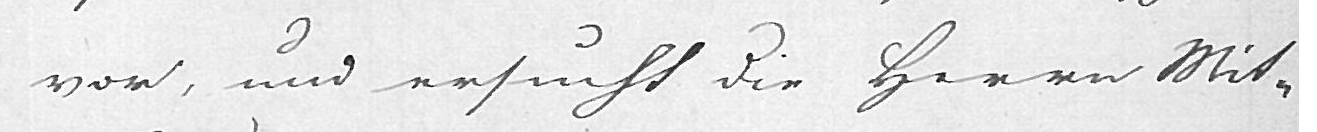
vor, und ersucht die Herrn Mit-
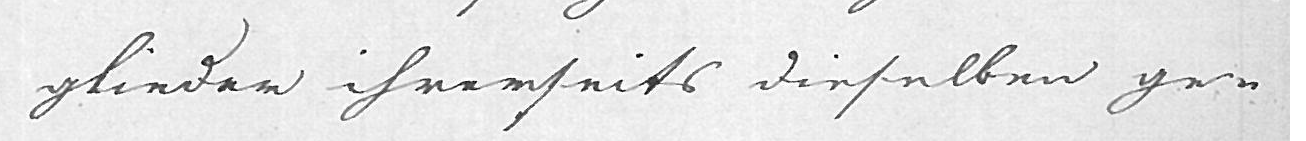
glieder ihrerseits dieselben ge-
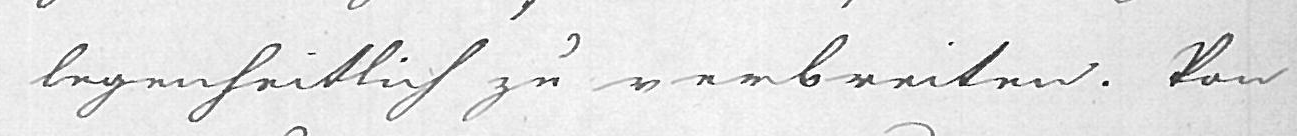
legenheitlich zu verbreiten. Von
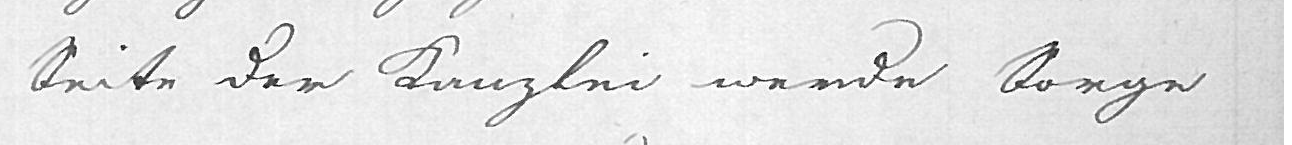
Seite der Kanzlei werde Sorge
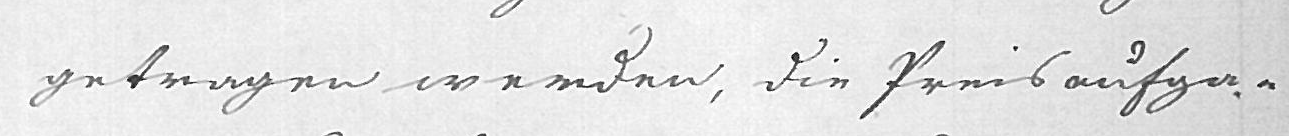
getragen werden, die Preisaufga-
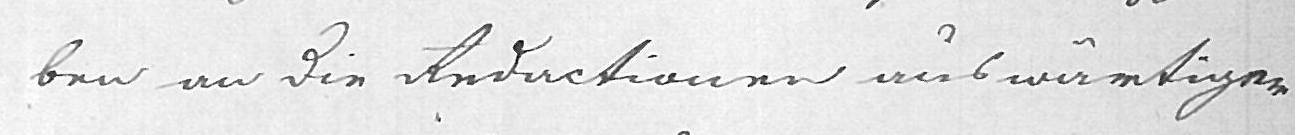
ben an die Redactionen auswärtiger
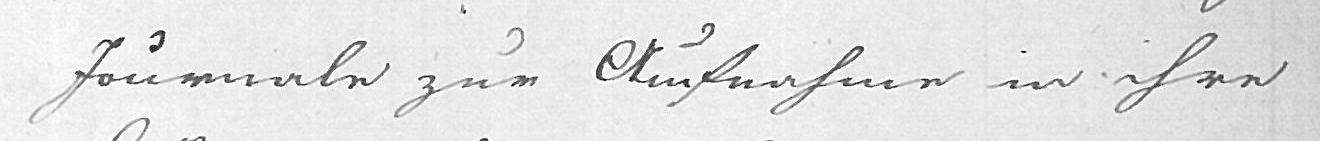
Journale zur Aufnahme in ihre
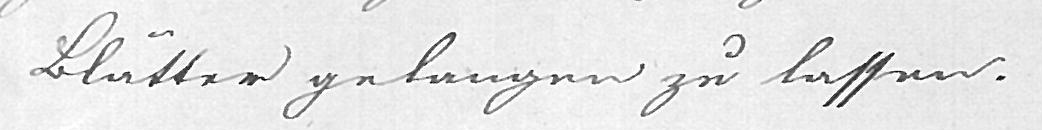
Blätter gelangen zu lassen.
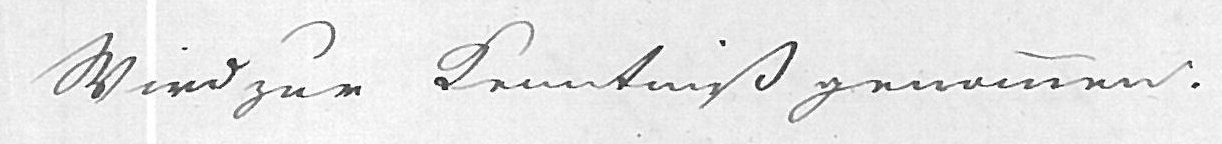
Wird zur Kenntniß genommen.
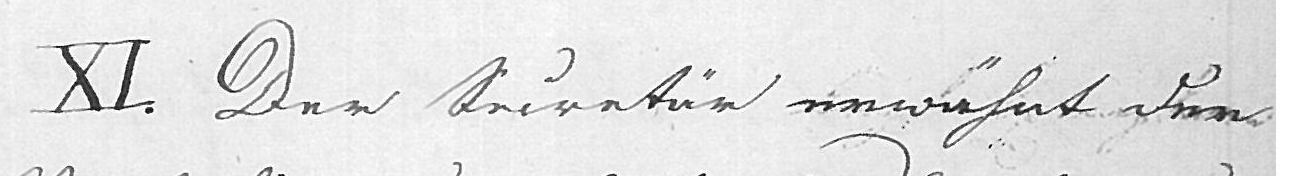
XI. Der Secretär erwähnt die
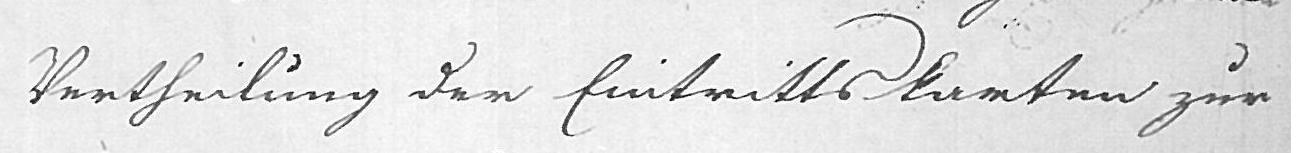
Vertheilung der Eintrittskarten zur
